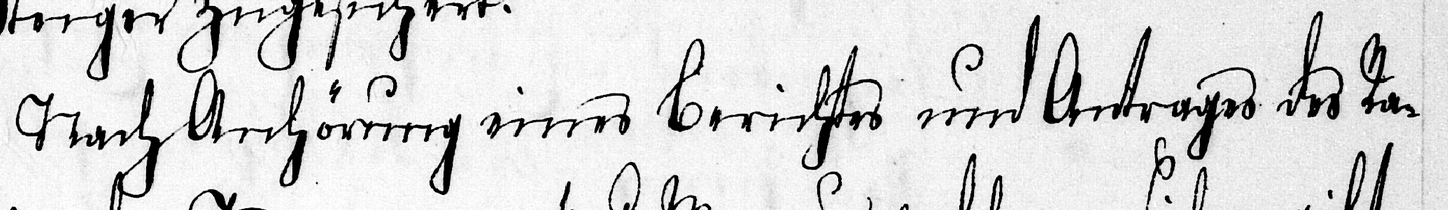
Nach Anhörung eines Berichtes und Antrages des Ra¬
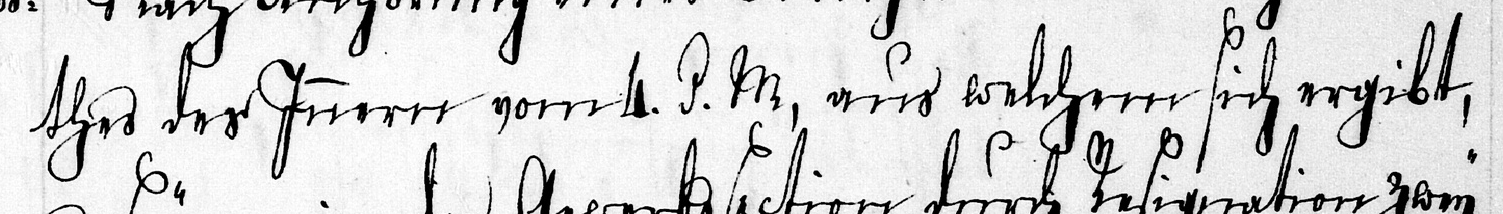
thes des Innern vom 4. d. M., aus welchem sich ergibt,
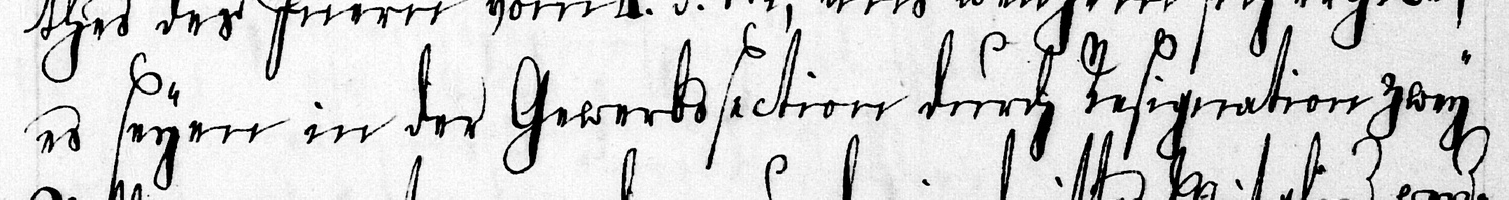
es seyen in der Gewerbssection durch Resignation zwey
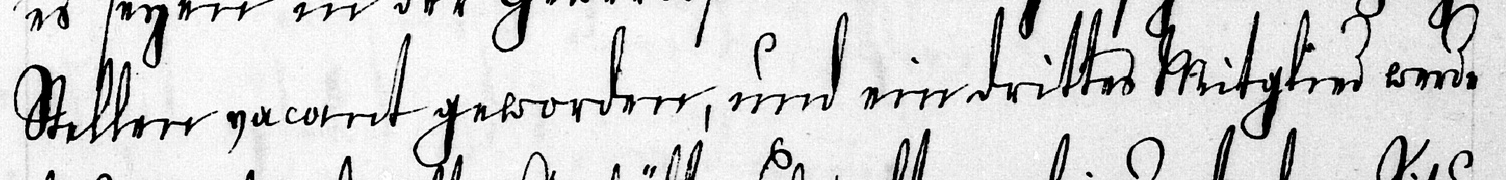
Stellen vacant geworden, und ein drittes Mitglied werde
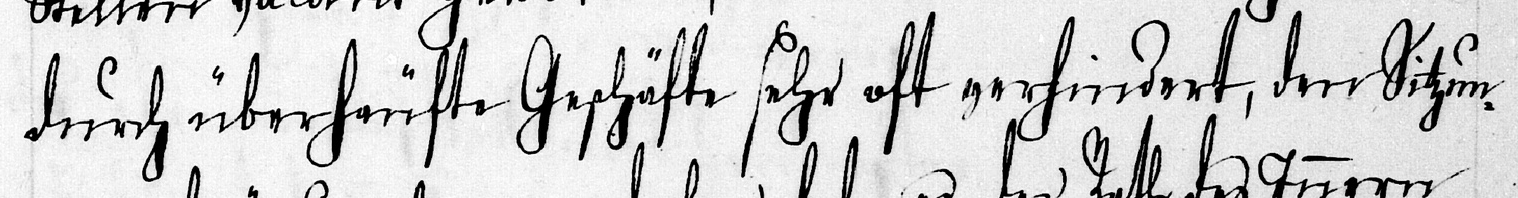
durch überhäufte Geschäfte sehr oft verhindert, den Sitzu¬
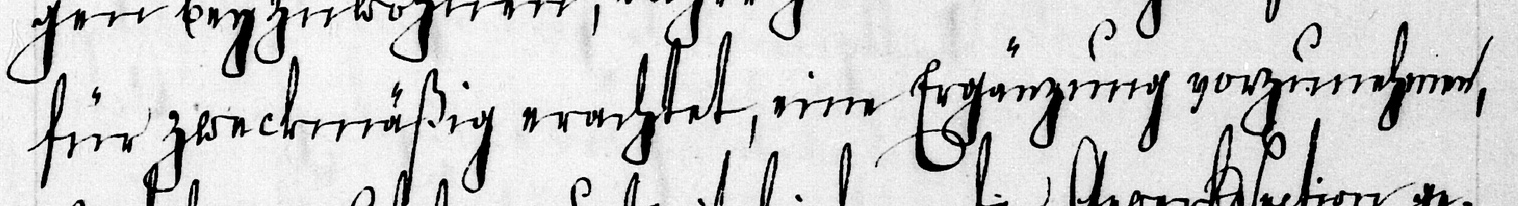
für zweckmäßig erachtet, eine Ergänzung vorzunehmen,
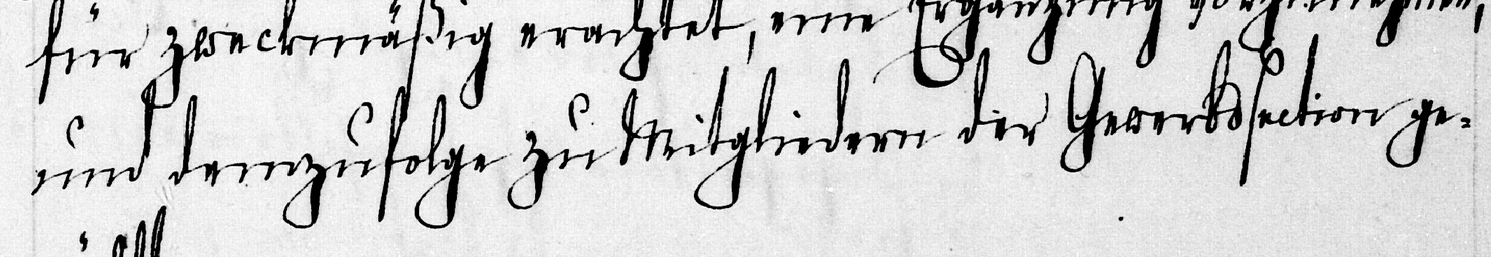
und demzufolge zu Mitgliedern der Gewerbssection ge¬
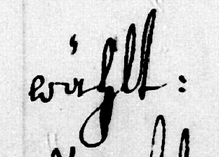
wählt:
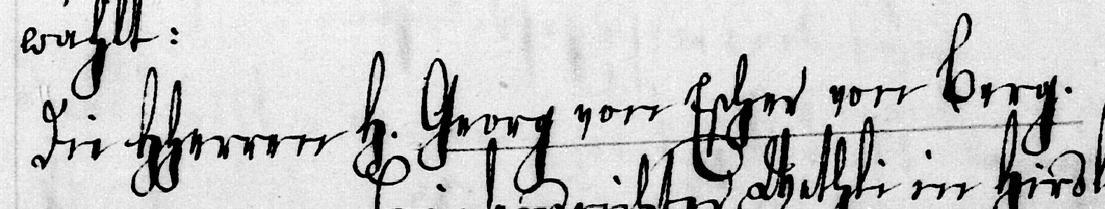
Die HHerren H. Georg von Escher von Berg.
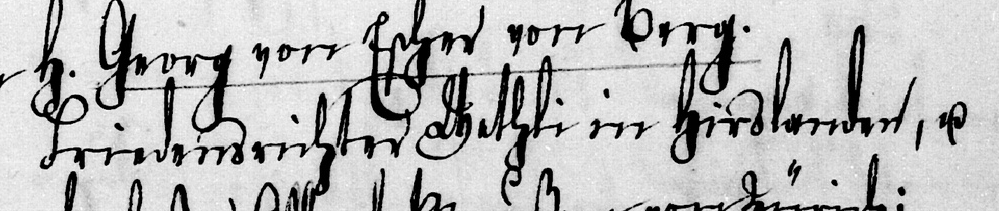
riedensrichter Wethli in Hirslanden, u
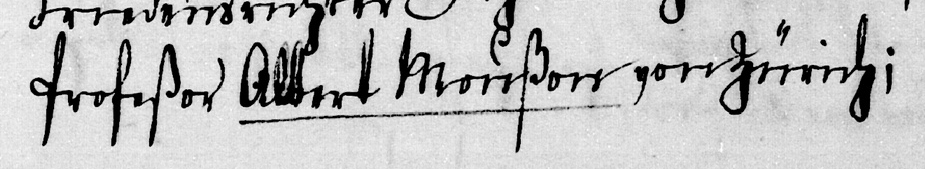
rofeßor Albert Moußon von Zürich;
